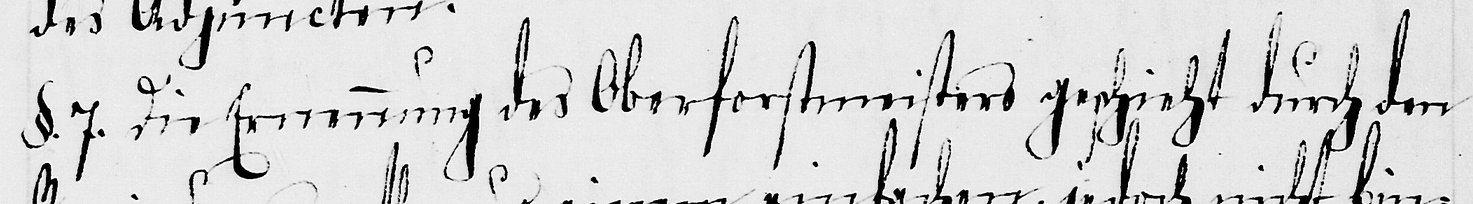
§. 7. Die Ernennung des Oberforstmeisters geschieht durch den
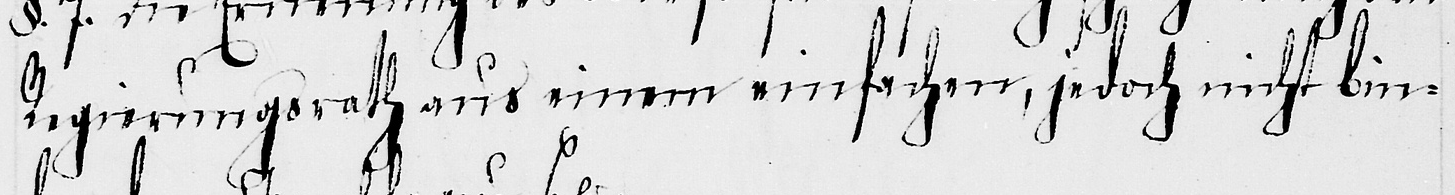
Regierungsrath aus einem einfachen, jedoch nicht bin¬
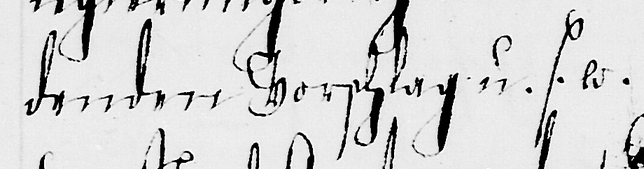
denden Vorschlag u. s. w.
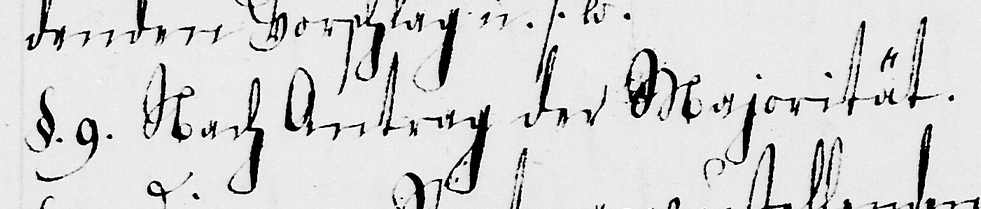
§. 9. Nach Antrag der Majorität.
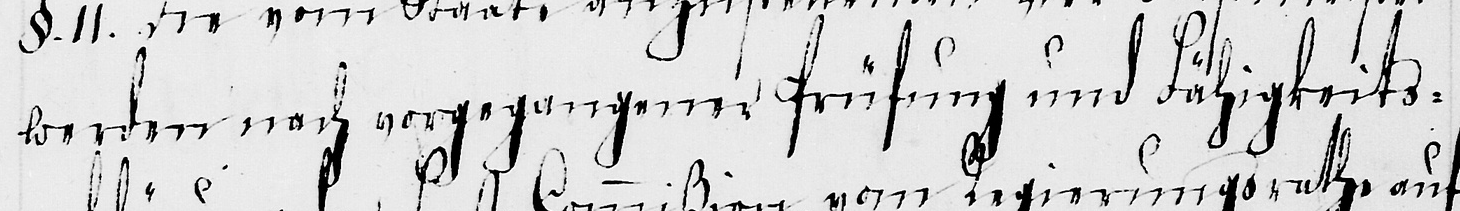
werden nach vorgegangener Prüfung und Fähigkeits¬
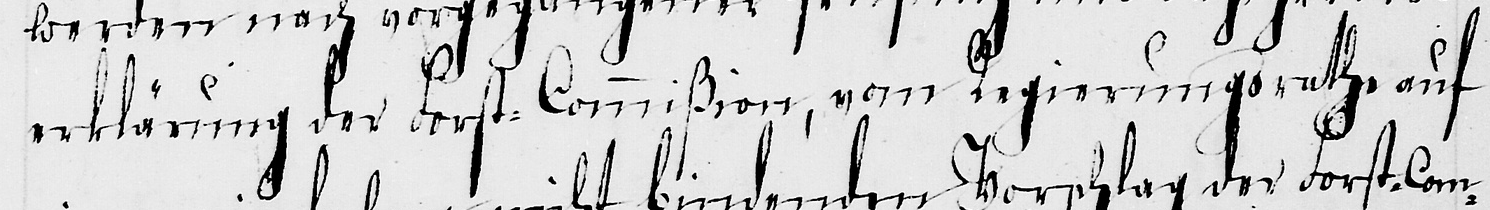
erklärung der Forst-Commißion, vom Regierungsrathe auf
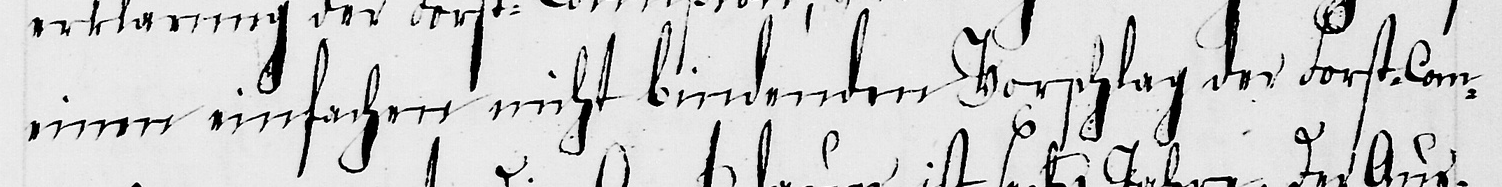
einen einfachen nicht bindenden Vorschlag der Forst-Com¬
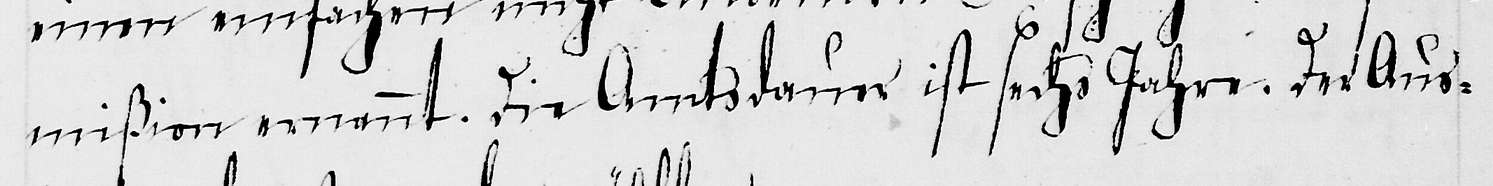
mißion ernannt. Die Amtsdauer ist sechs Jahre. Der Aus¬
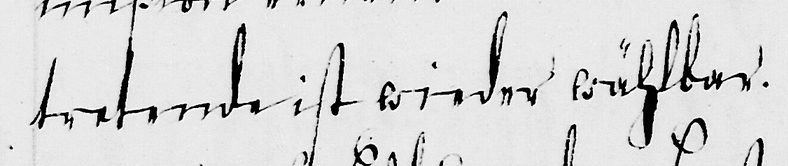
tretende ist wieder wählbar.
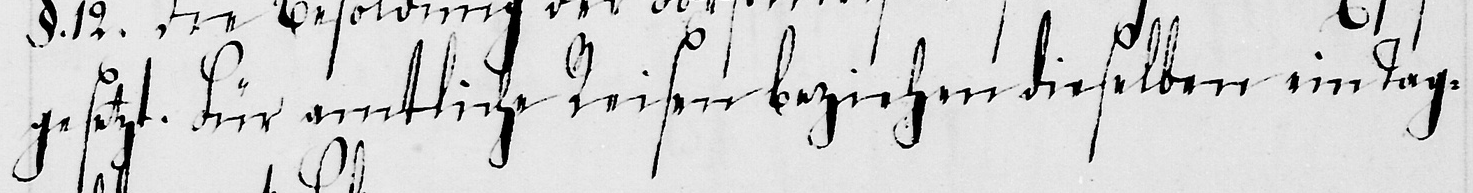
gesetzt. Für amtliche Reisen beziehen dieselben ein Tag¬
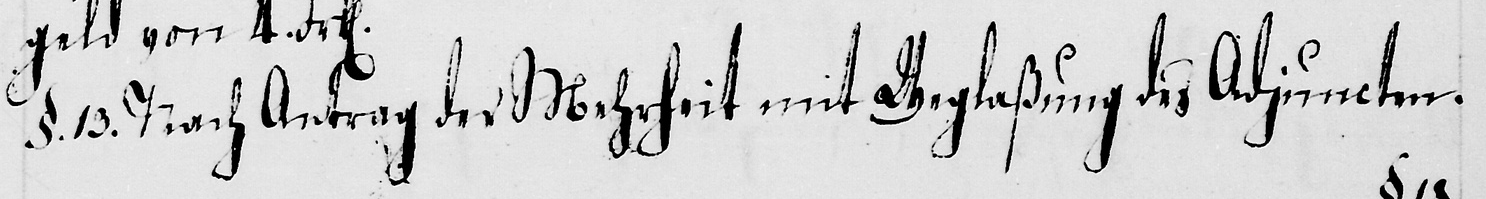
§.13. Nach Antrag der Mehrheit mit Weglaßung des Adjuncten.
